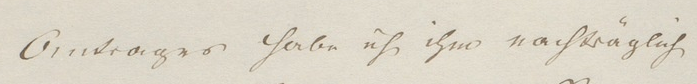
Antrages habe ich ihm nachträglich
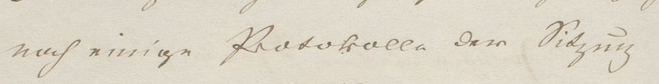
noch einige Protokolle der Sitzung
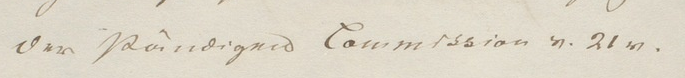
der ständigen Commission v. 21. v.
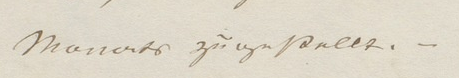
Monats zugestellt. –
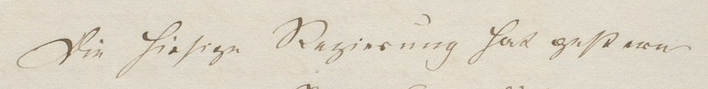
Die hiesige Regierung hat gestern
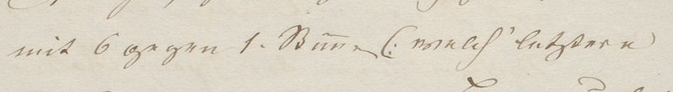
mit 6 gegen 1. Stimmen (:welch' letztere
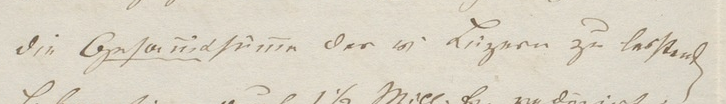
die Gesammtsumme der in Luzern zu leistenden
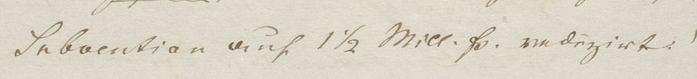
Subvention auf 1½ Mill fs. reduzirt
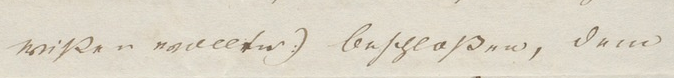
wißen wollte:) beschloßen, dem
